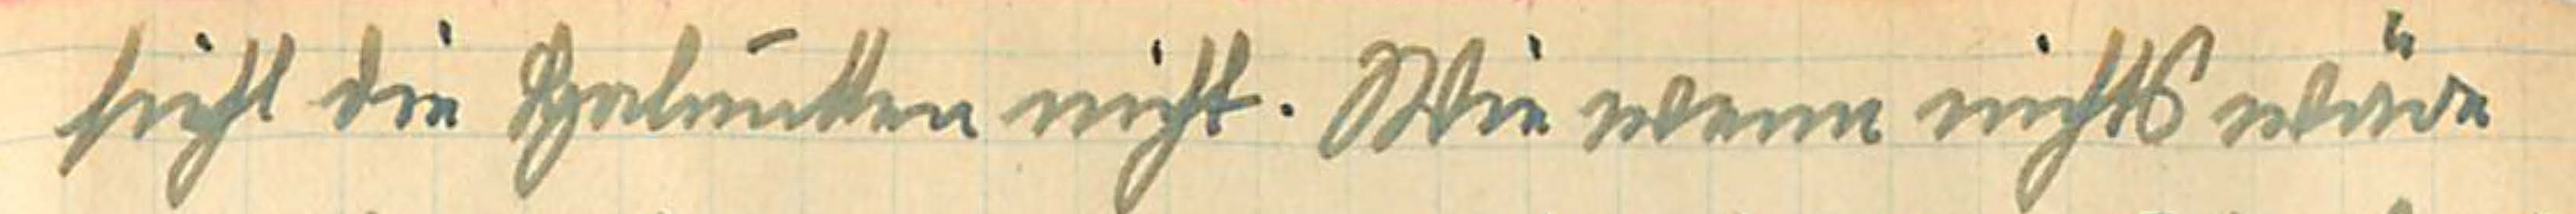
sieht die Halunken nicht. Wie wenn nichts wäre
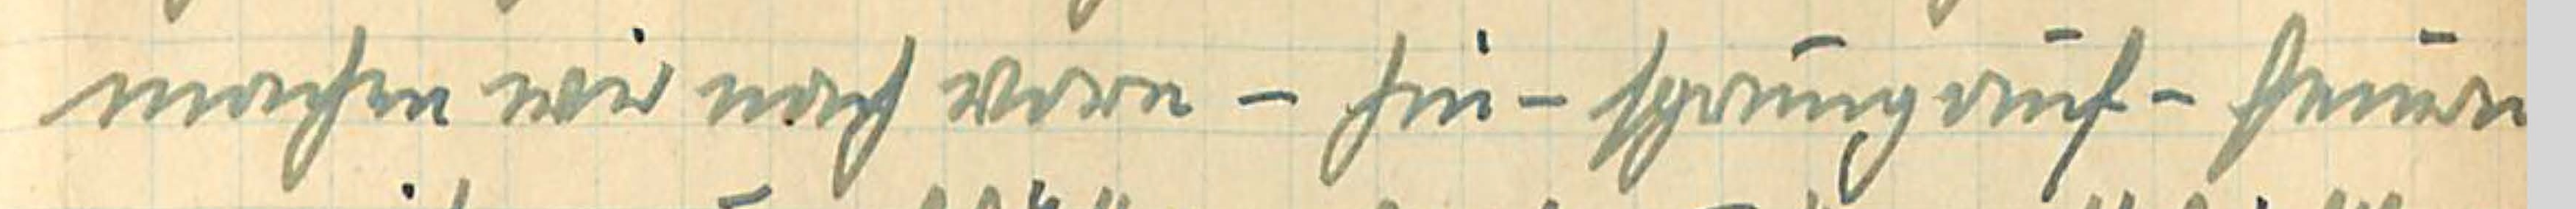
machen wir nach vorn – hin – sprung auf – feuern
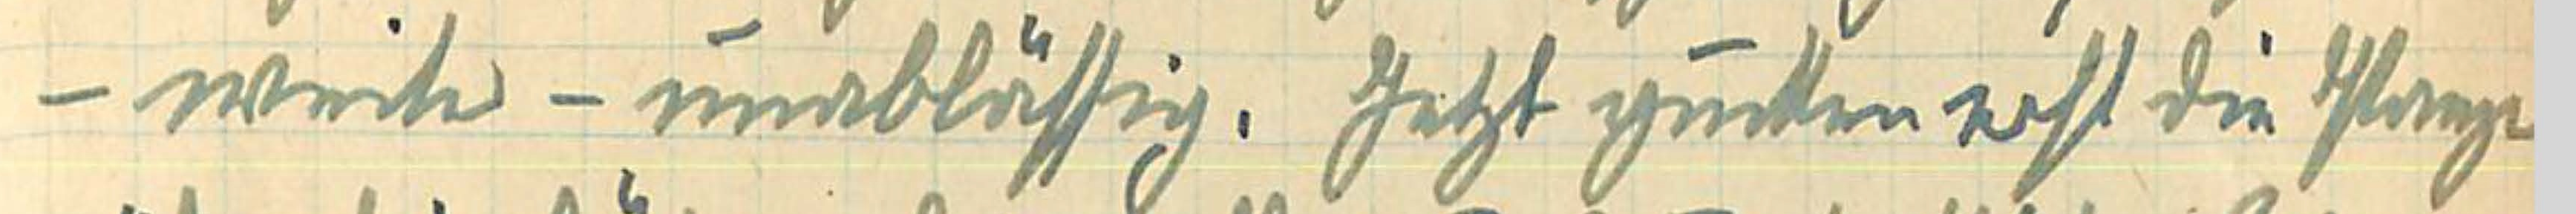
– weiter – unablässig. Jetzt gucken erst die Panzer
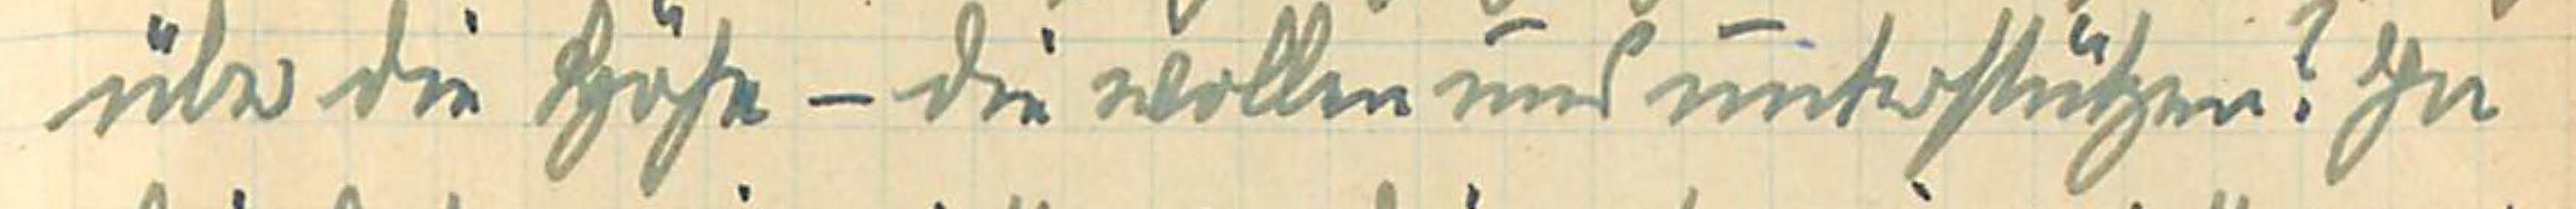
über die Höhe – die wollen uns unterstützen? Ja
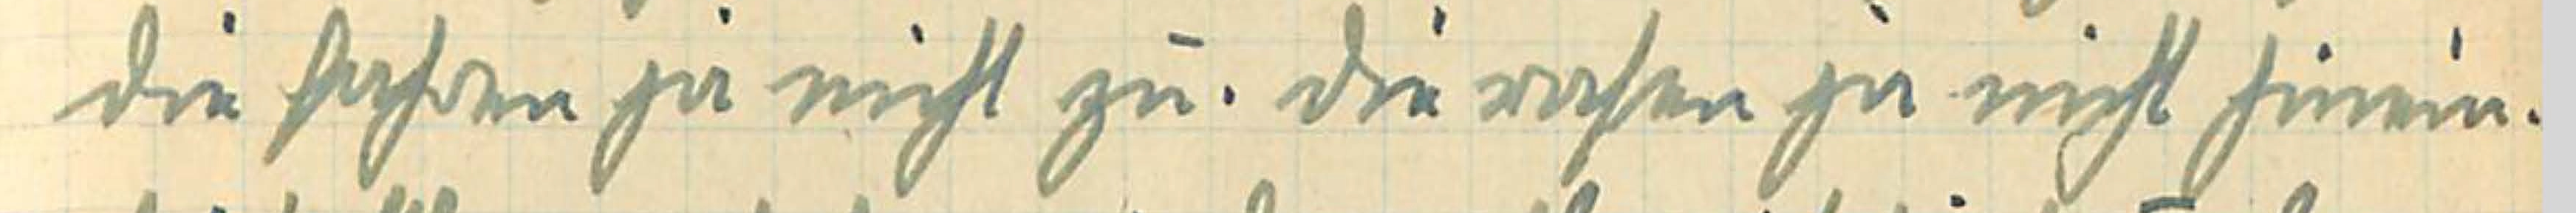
die fahren ja nicht zu. Die rasen ja nicht hinein.
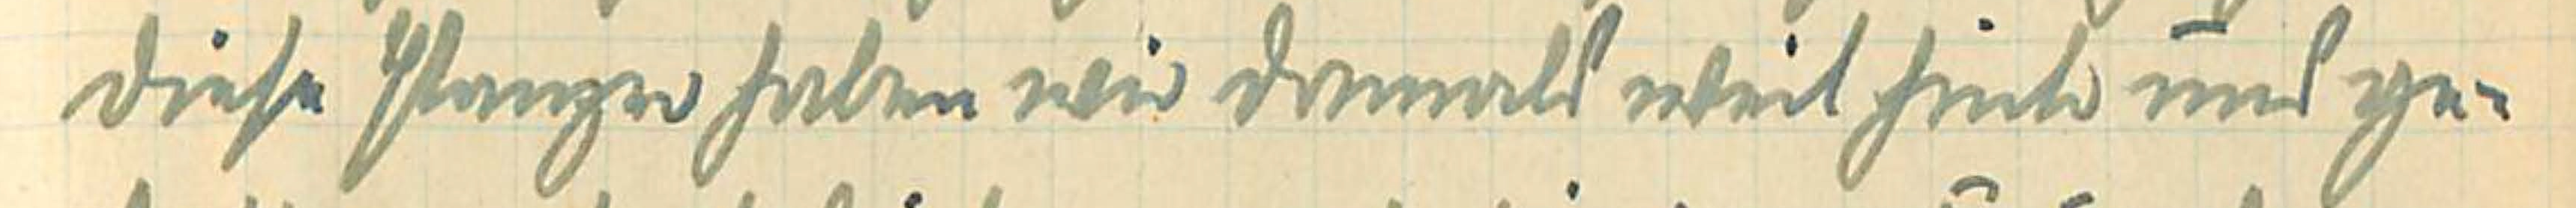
Diese Panzer haben wir damals weit hinter uns ge-
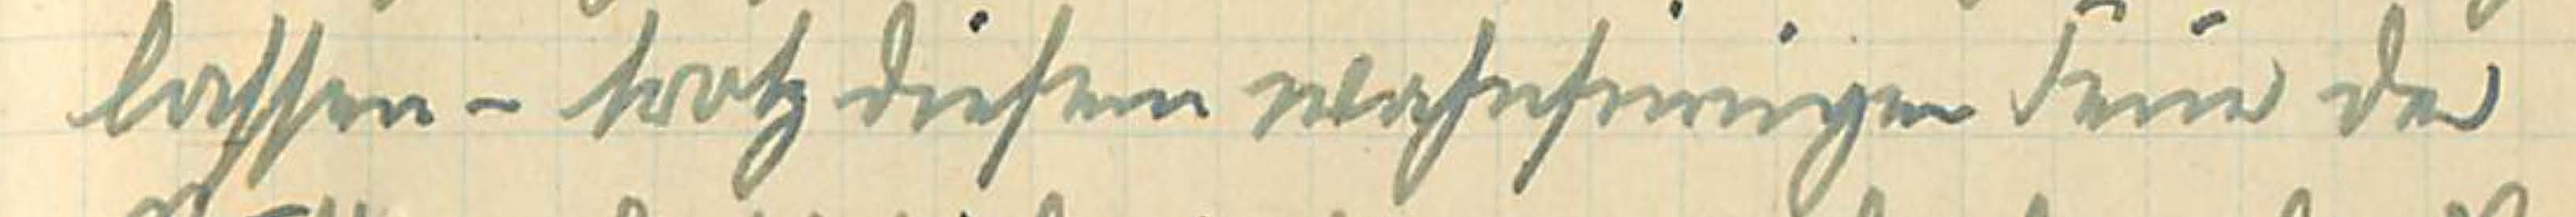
lassen – trotz diesem wahnsinnigen Feuer der
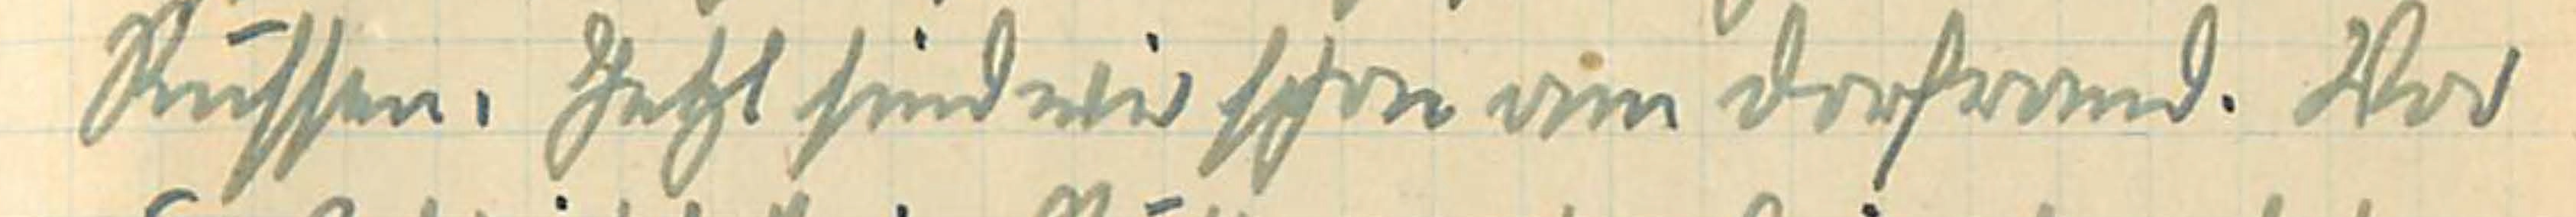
Russen. Jetzt sind wir schon am Dorfrand. Vor
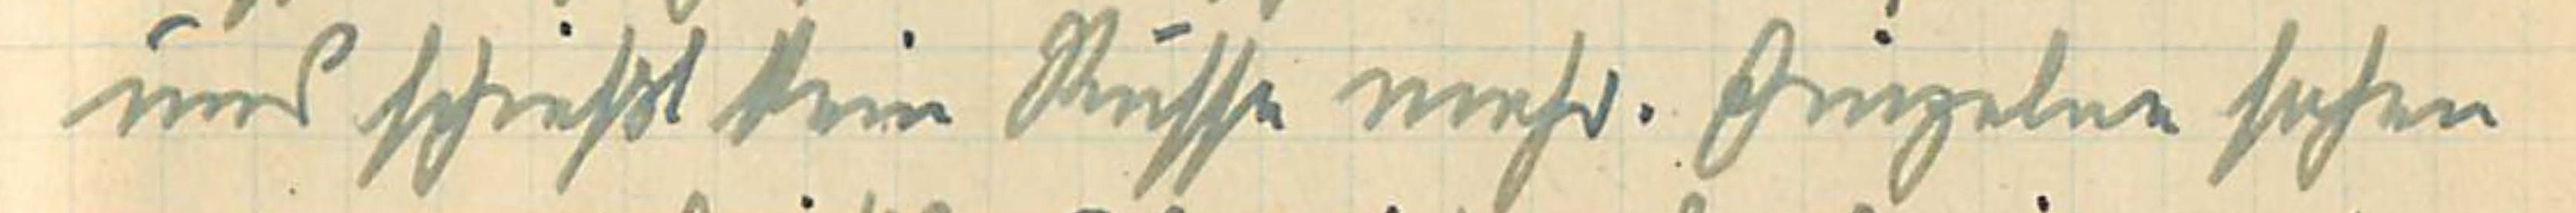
uns schießt kein Russe mehr. Einzelne sehen
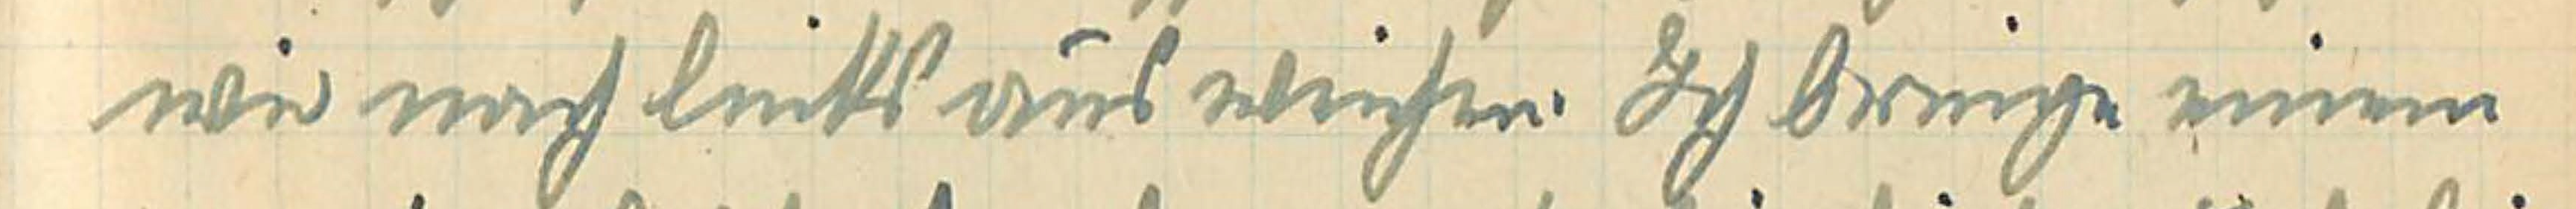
wir nach links ausweichen. Ich bringe einem
